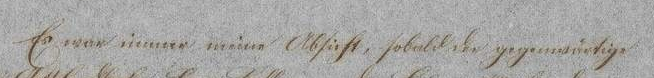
Es war immer meine Absicht, sobald der gegenwärtige
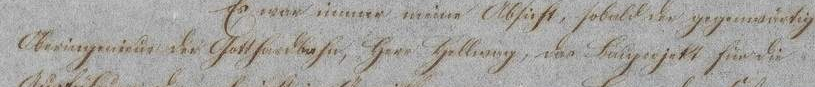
Oberingenieur der Gotthardbahn, Herr Hellwag, das Bauprojekt für die
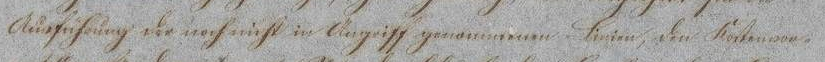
Ausführung der noch nicht in Angriff genommenen Linien, den Kostenvor-
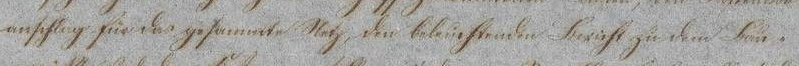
anschlag für das gesammte Netz, den beleuchtenden Bericht zu dem Bau-
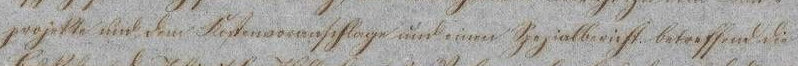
projekte und dem Kostenvoranschlage und einen Spezialbericht betreffend die
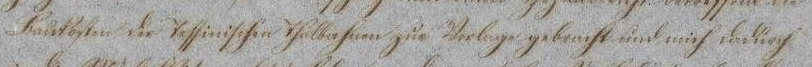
Baukosten der Tessinischen Thalbahnen zur Vorlage gebracht und mich dadurch
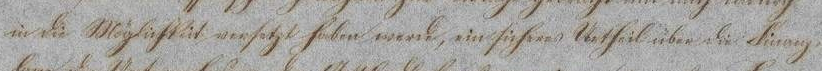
in die Möglichkeit versetzt haben werde, ein sicheres Urtheil über die Finanz-
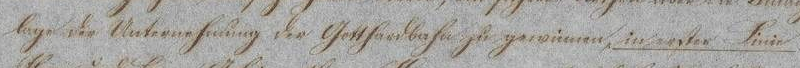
lage der Unternehmung der Gotthardbahn zu gewinnen, in erster Linie
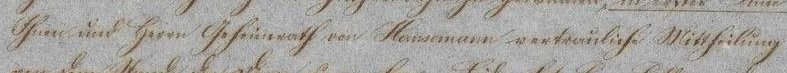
Ihnen und Herrn Geheimrath von Hansemann vertrauliche Mittheilung
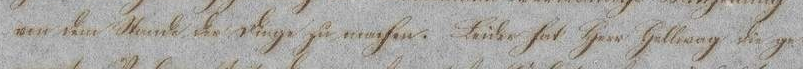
von dem Stande der Dinge zu machen. Leider hat Herr Hellwag die ge-
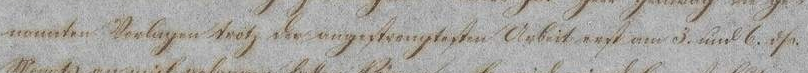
nannten Vorlagen trotz der angestrengtesten Arbeit erst am 3. und 6. dss.
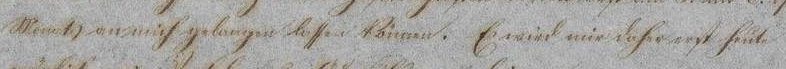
Monats an mich gelangen lassen können. Es wird mir daher erst heute
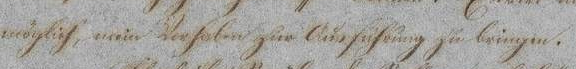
möglich, mein Vorhaben zur Ausführung zu bringen.
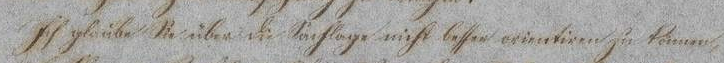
Ich glaube Sie über die Sachlage nicht besser orientiren zu können,
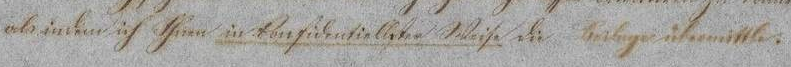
als indem ich Ihnen in konfidentiellster Weise die Beilage übermittle.
